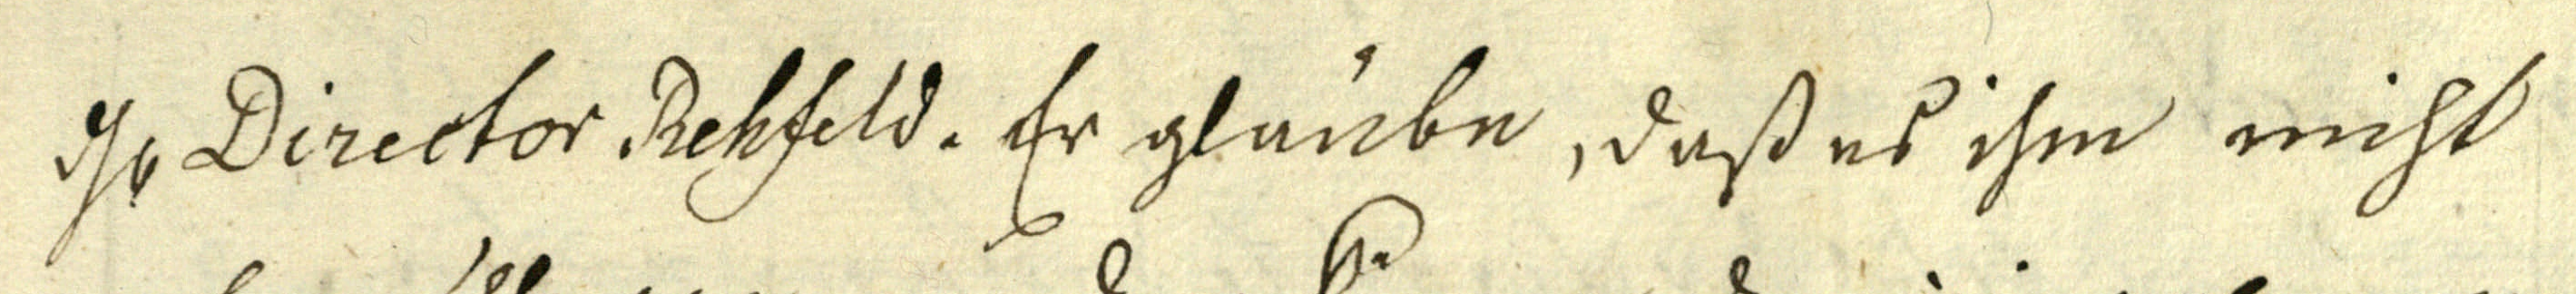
dh Director Rehfeld. Er glaube, daß es ihm nicht
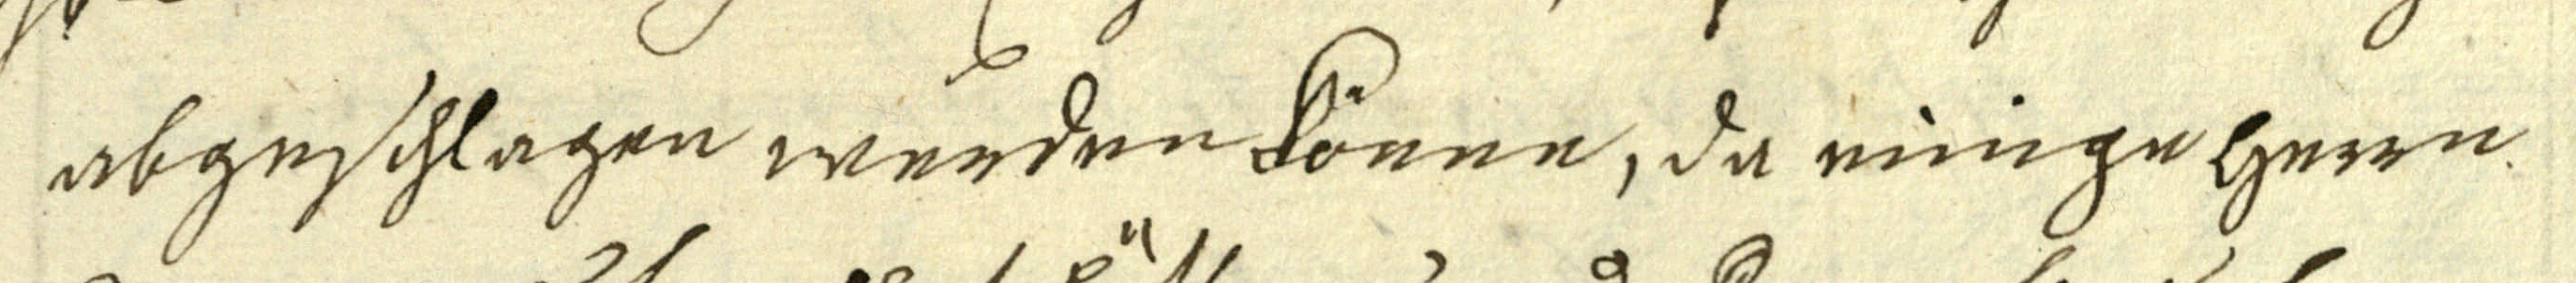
abgeschlagen werden könne, da einige Herrn
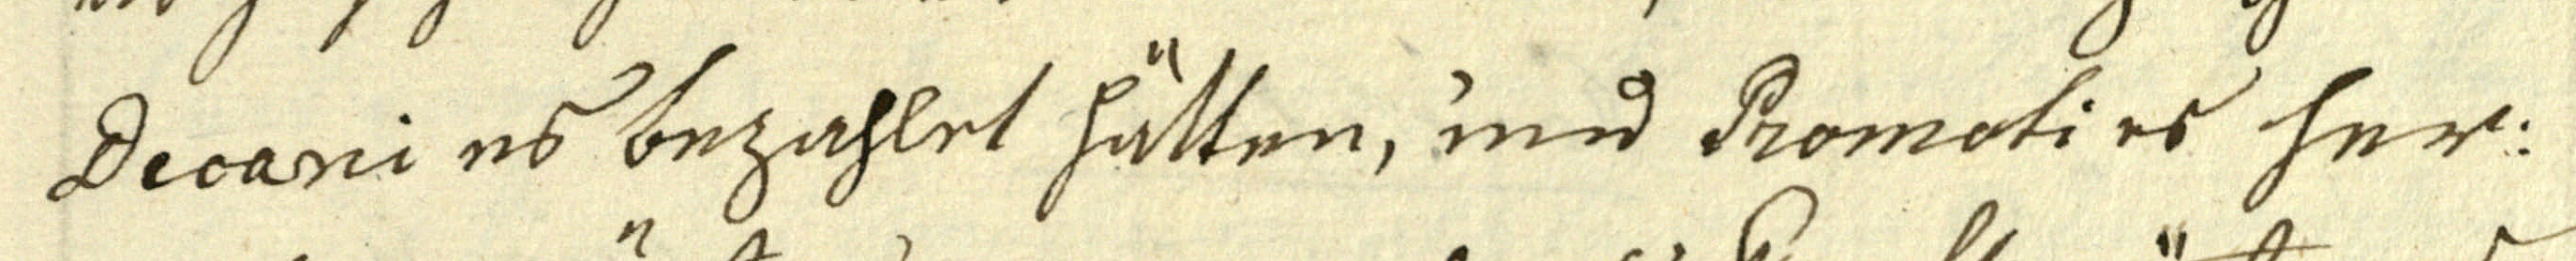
Decani es bezahlet hätten, und Promoti es her¬
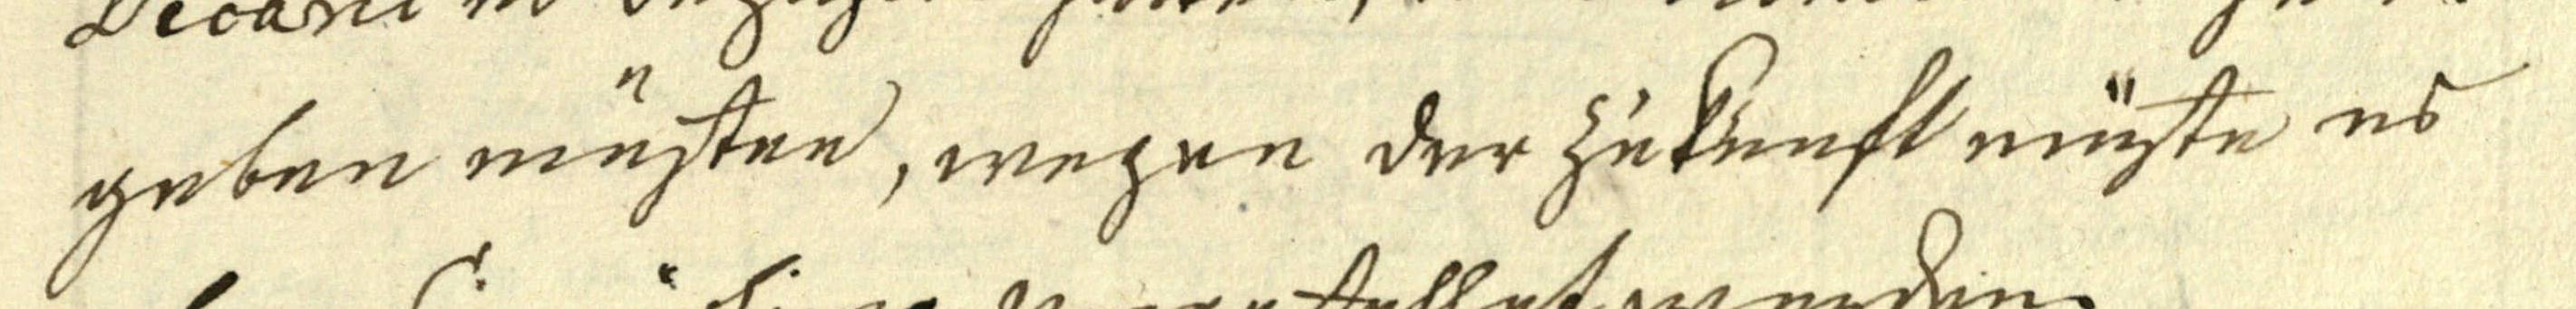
geben müsten, wegen der Zukunft müßte es
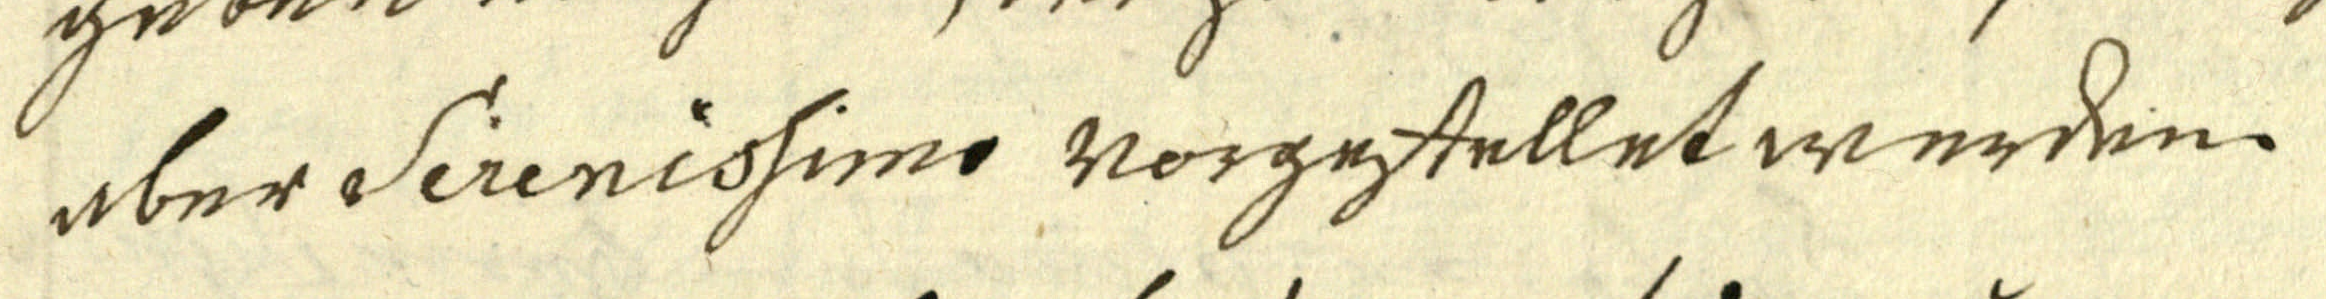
aber Serenissimo vorgestellet werden.
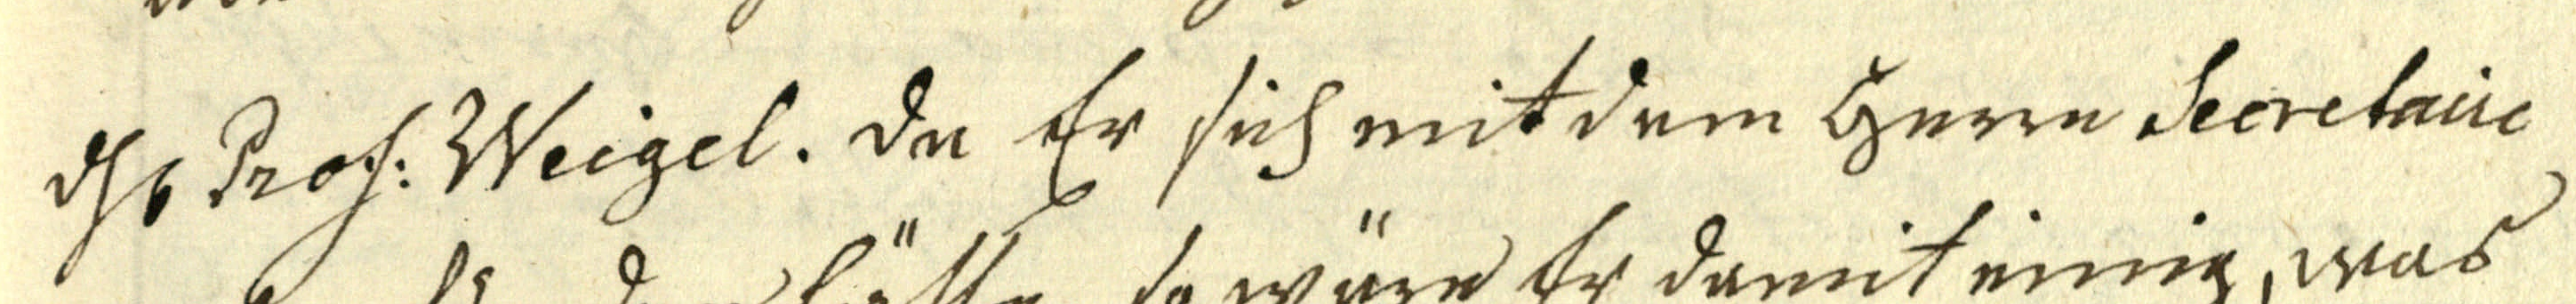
dh Prof. Weigel. Da Er sich mit dem Herrn Secretaire
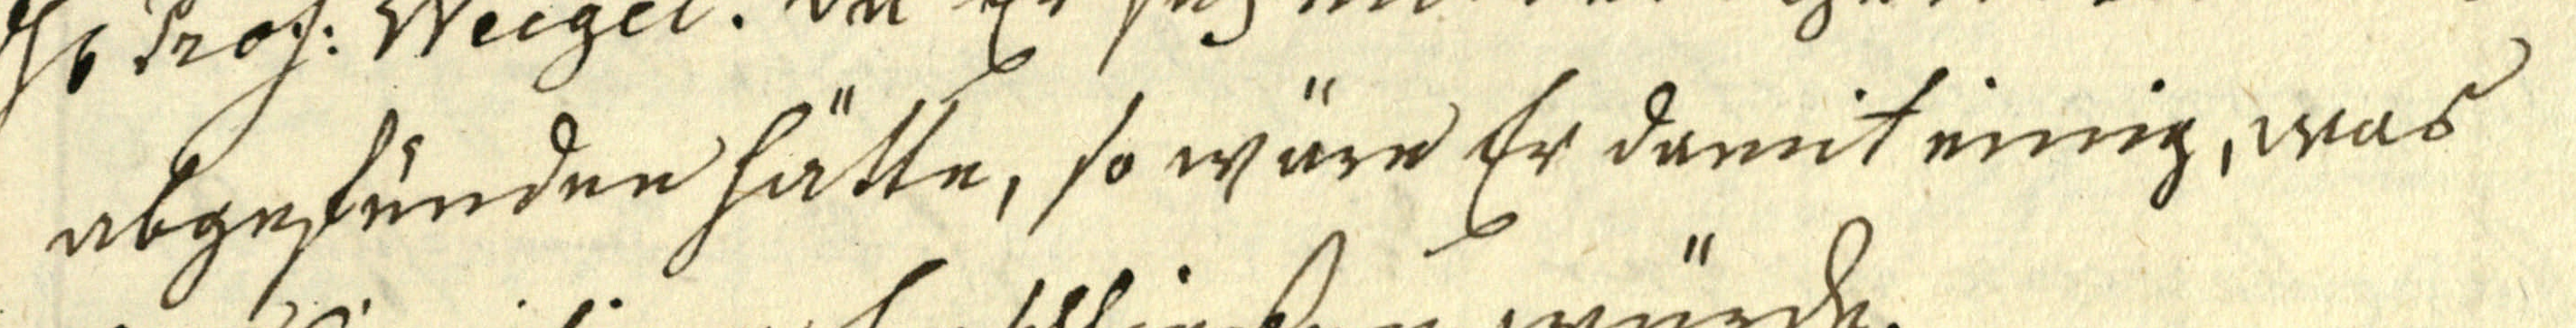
abgefunden hätte, so wäre Er damit einig, was
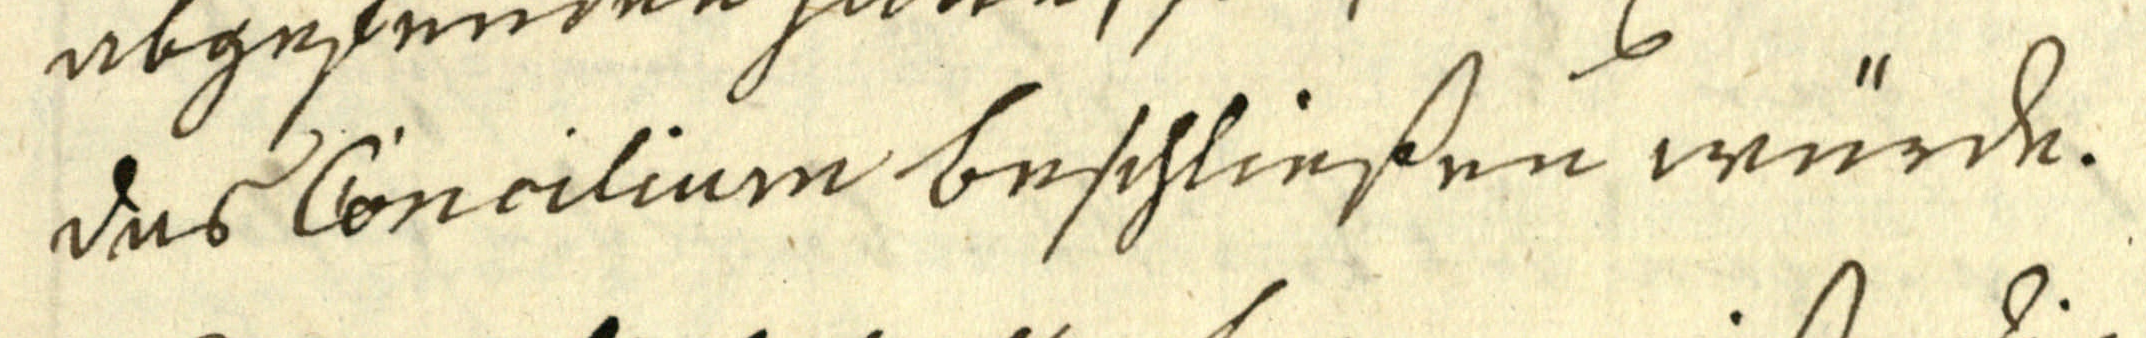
das Concilium beschließen würde.
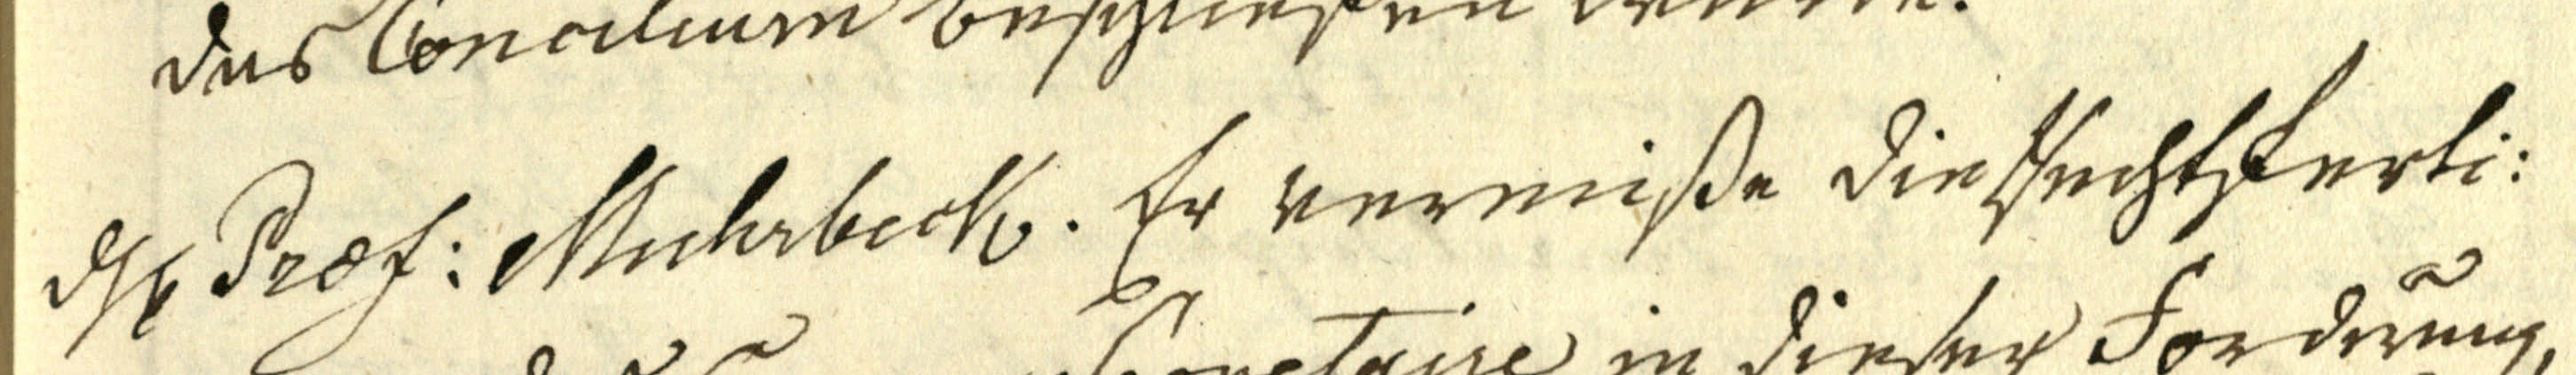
dh Prof. Muhrbeck. Er vermiße die Rechtferti¬
